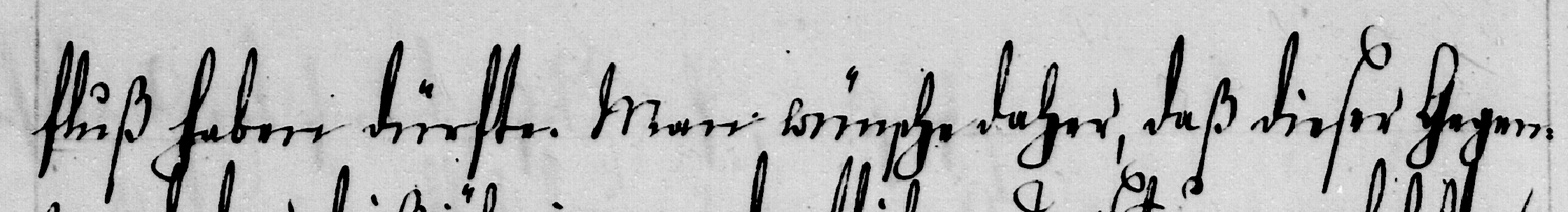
fluß haben dürfte. Man wünsche daher, daß dieser Gege¬
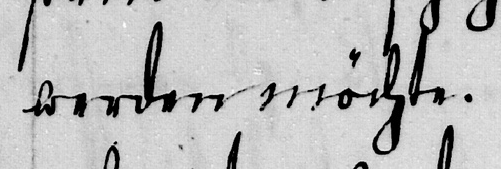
werden möchte.
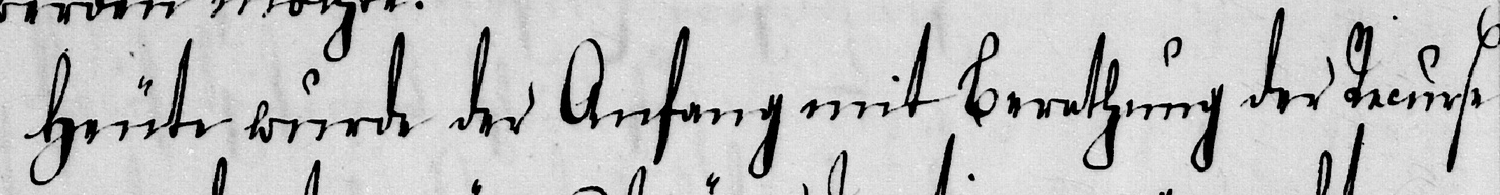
Heute wurde der Anfang mit Berathung der Recurse
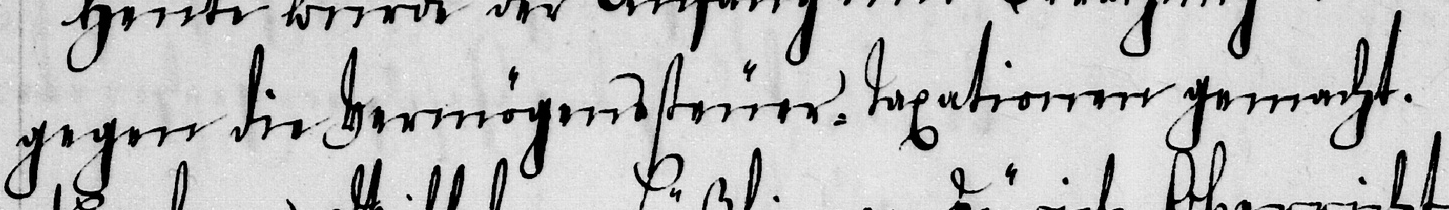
gegen die Vermögenssteuer-Taxationen gemacht.
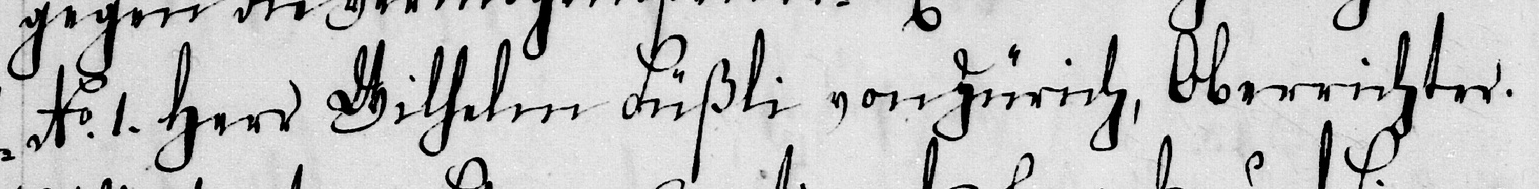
No.1. Herr Wilhelm Füßli von Zürich, Oberrichter.
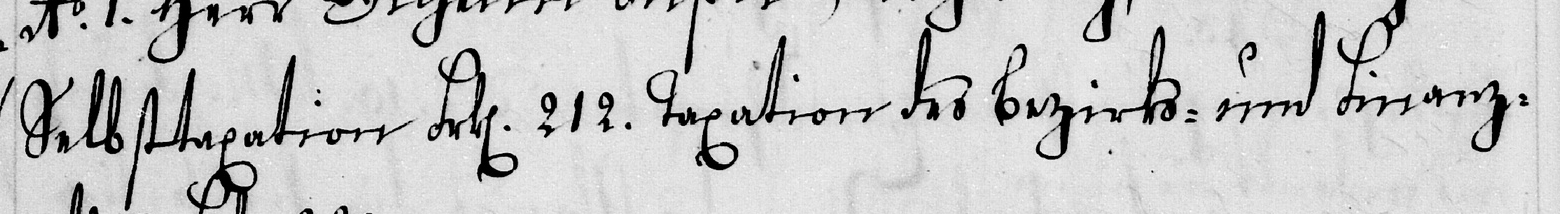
Selbsttaxation Frk[en]. 212. Taxation des Bezirks- und Finanz¬
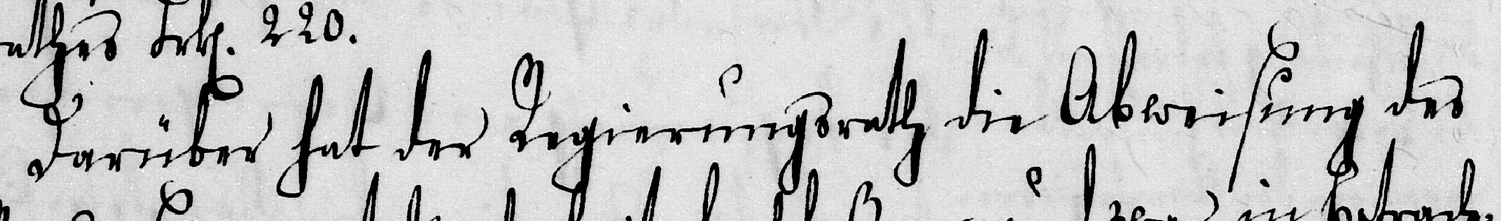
Darüber hat der Regierungsrath die Abweisung des
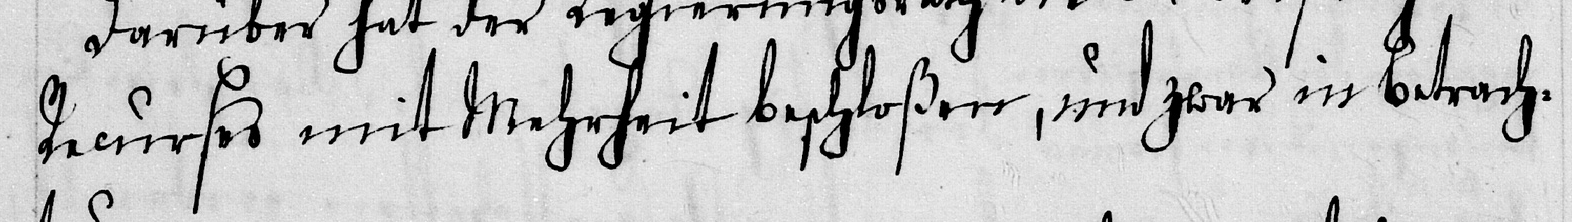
Recurses mit Mehrheit beschloßen, und zwar in Betrach¬
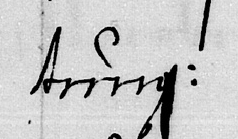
tung:
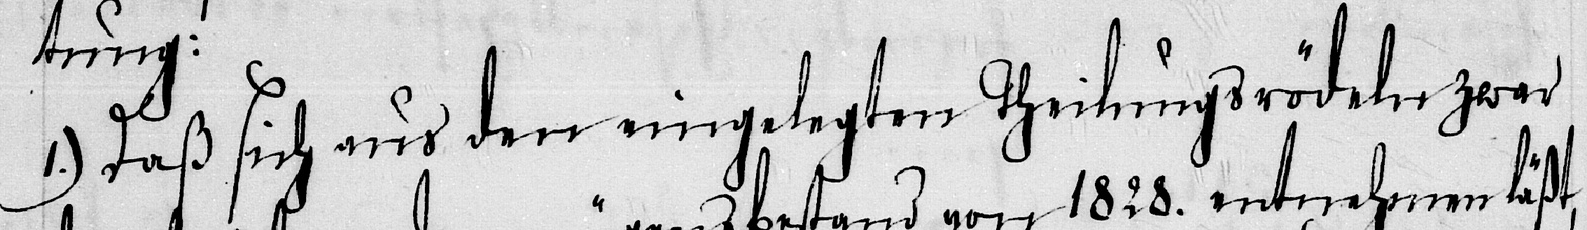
1.) Daß sich aus den eingelegten Theilungsrödeln zwar
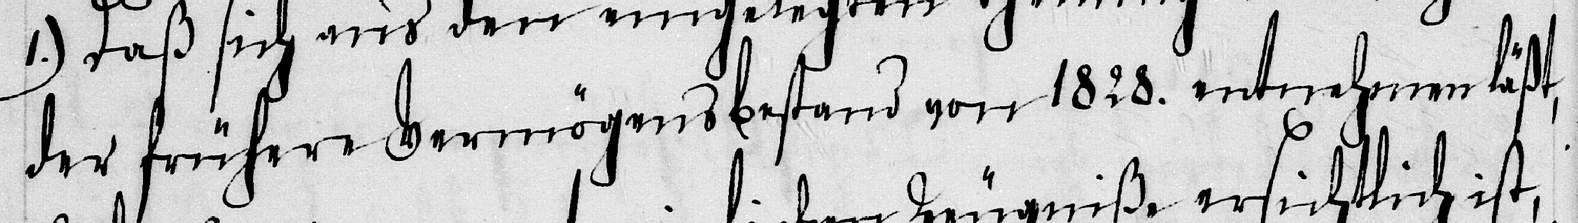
der frühere Vermögensbestand von 1828. entnehmen läßt,
